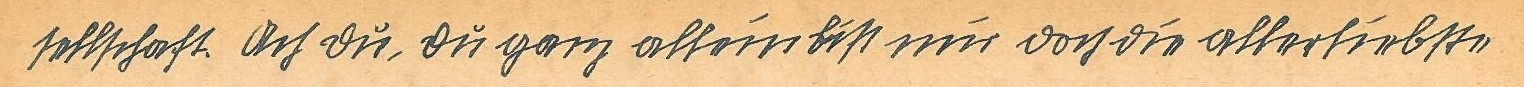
sellschaft. Ach Du, Du ganz allein bist mir die allerliebste
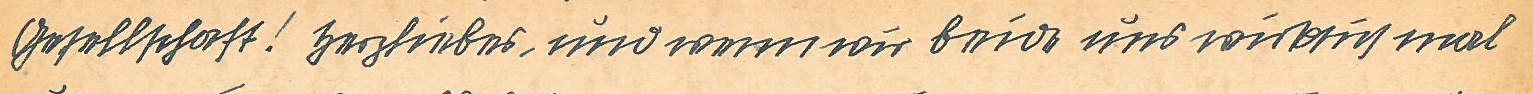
Gesellschaft! Herzliebes, und wenn wir beide uns wirklich mal
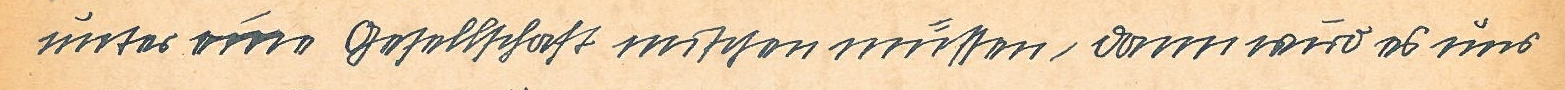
unter eine Gesellschaft mischen müssen, dann wird es uns
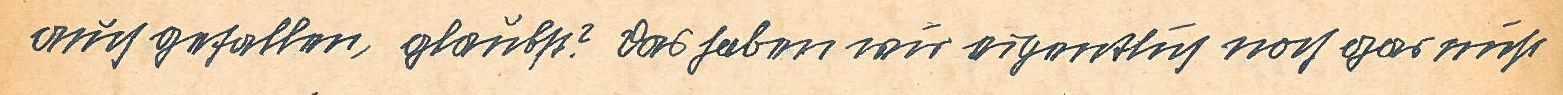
auch gefallen, glaubst? Das haben wir eigentlich noch gar nicht
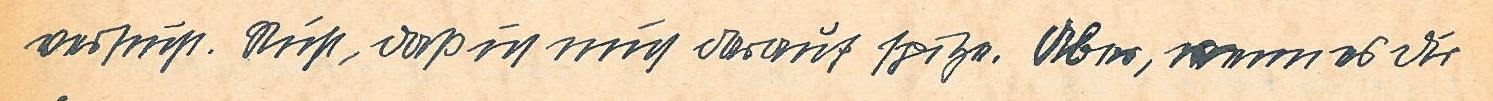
versucht. Nicht daß ich mich darauf spitze. Aber, wenn es Dir
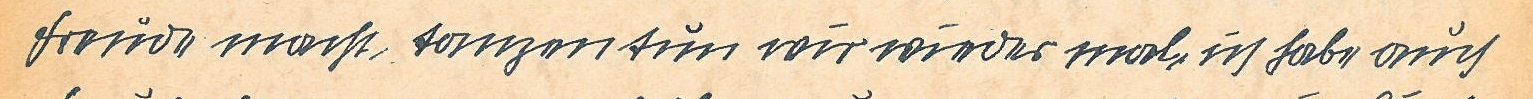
Freude macht, tanzen tun wir wieder mal, ich habe auch
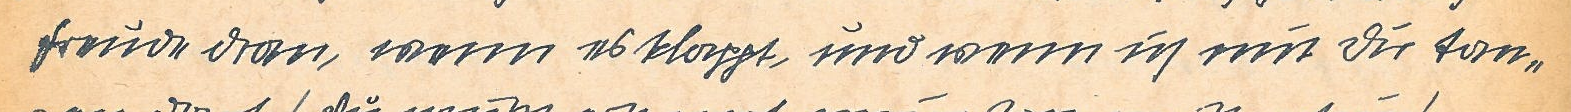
Freude dran, wenn es klappt, und wenn ich mit Dir tan¬
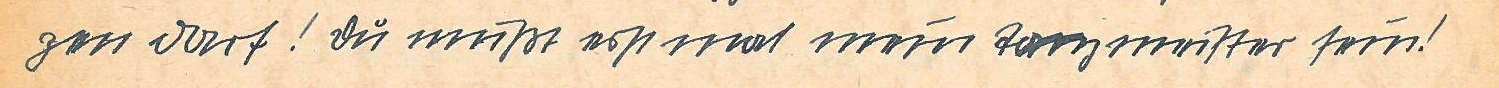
zen darf! Du mußt erst mal mein Tanzmeister sein!
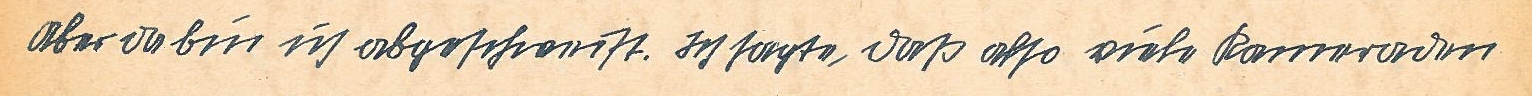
Aber da bin ich abgeschweift. Ich sagte, daß also viele Kameraden
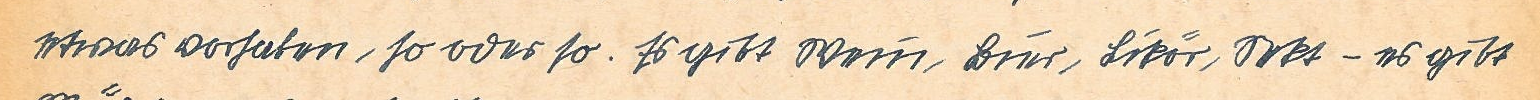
etwas vorhaben, so oder so. Es gibt Wein, Bier, Likör, Sekt — es gibt
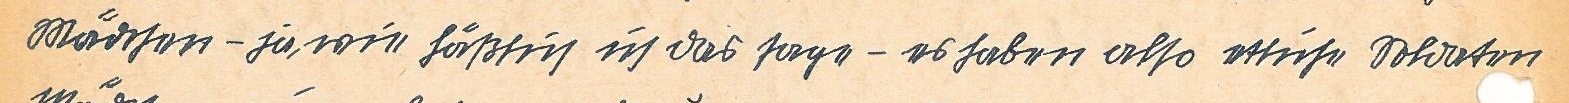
Mädchen — ja, wie häßlich ich das sage — es haben also etliche Soldaten
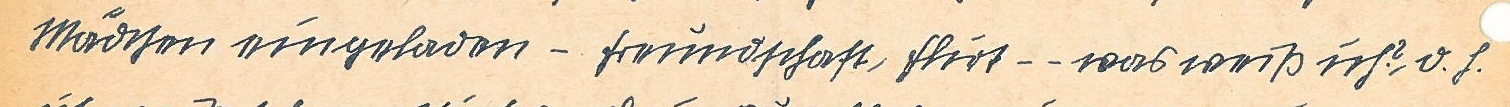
Mädchen eingeladen — Freundschaft, Flirt – – was weiß ich?, d. h.
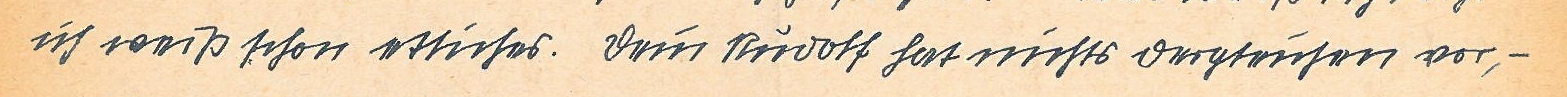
ich weiß schon etliches. Dein hat nichts dergleichen vor, —
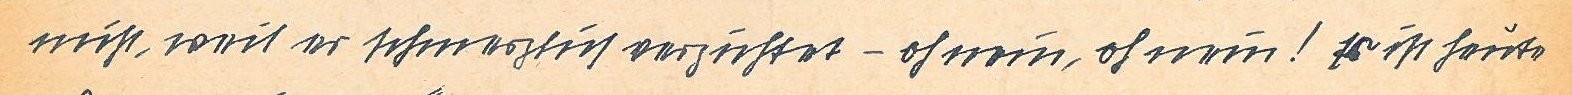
nicht weil er schmerzlich verzichtet — oh nein, oh nein! Er ist heute
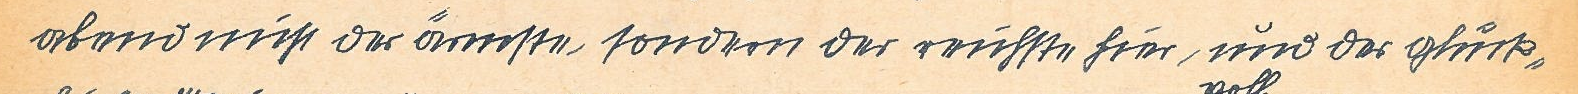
abend nicht der ärmste, sondern der reichste hier, und glück¬
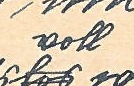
voll
